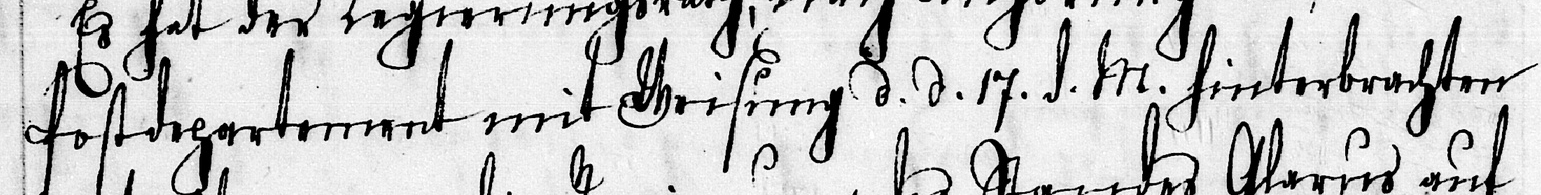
Postdepartement mit Weisung d. d. 17. d. M. hinterbrachten
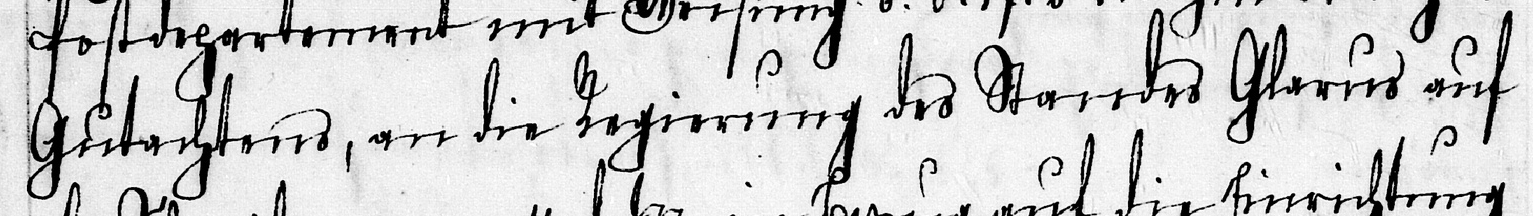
Gutachtens, an die Regierung des Standes Glarus auf
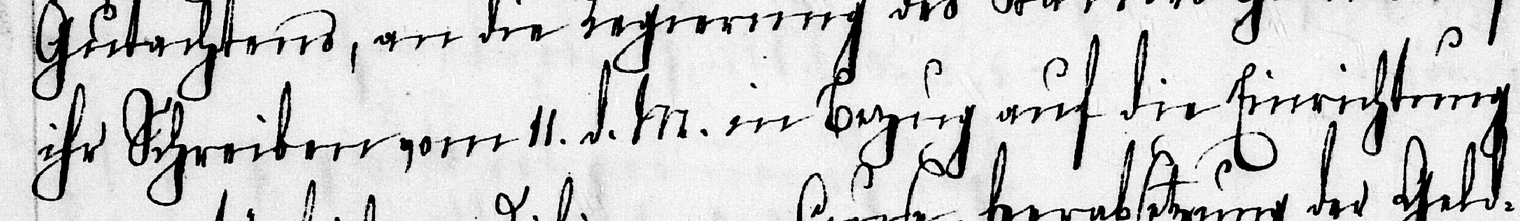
ihr Schreiben vom 11. d. M. in Bezug auf die Einrichtung
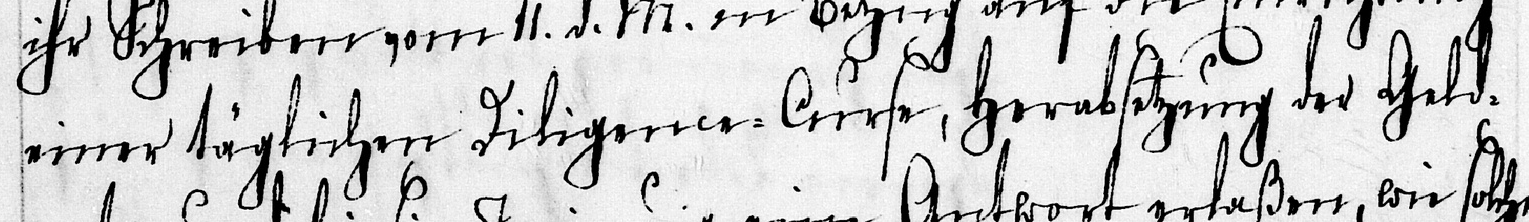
einer täglichen Diligence-Curse, Herabsetzung der Geld¬
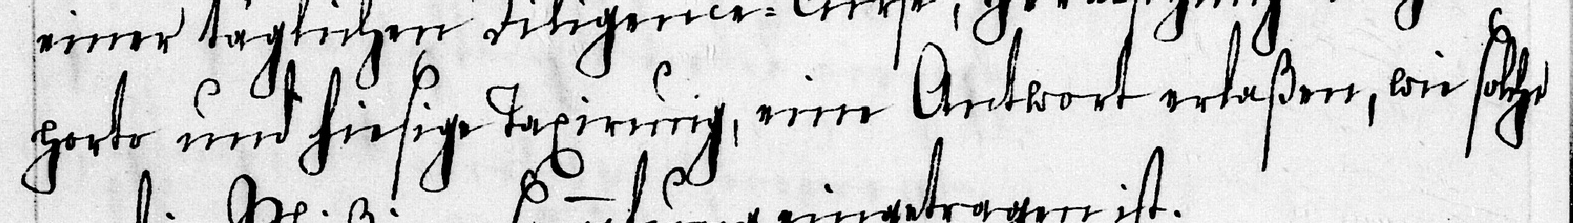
porto und hiesige Taxirung, eine Antwort erlaßen, wie solche
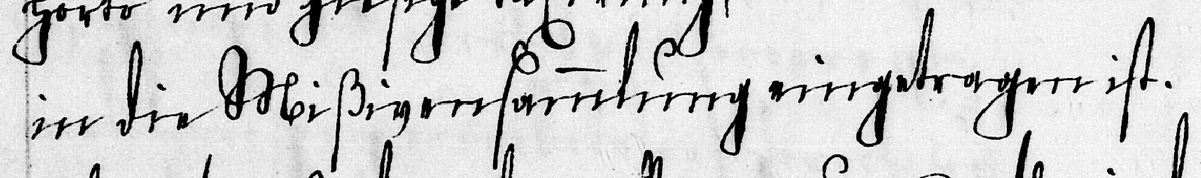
in die Mißivensammlung eingetragen ist.
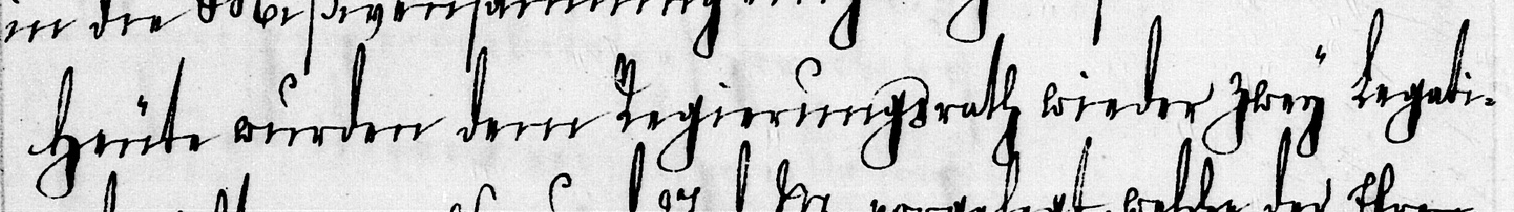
Heute wurden dem Regierungsrath wieder zwey Legati¬
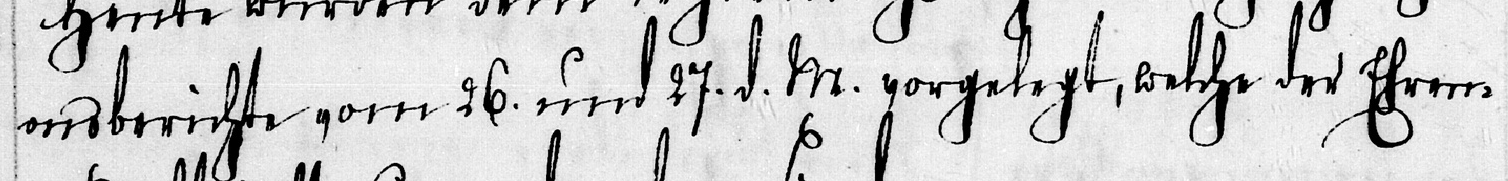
onsberichte vom 26. und 27. d. M. vorgelegt, welche der Ehren¬
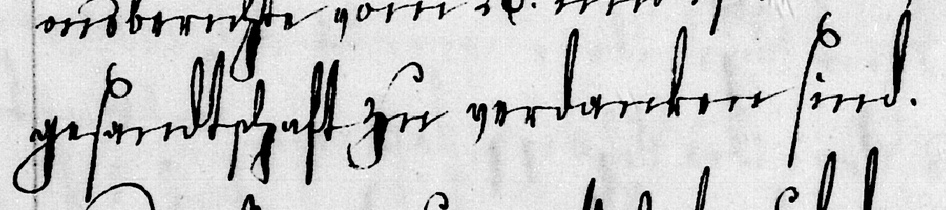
gesandtschaft zu verdanken sind.
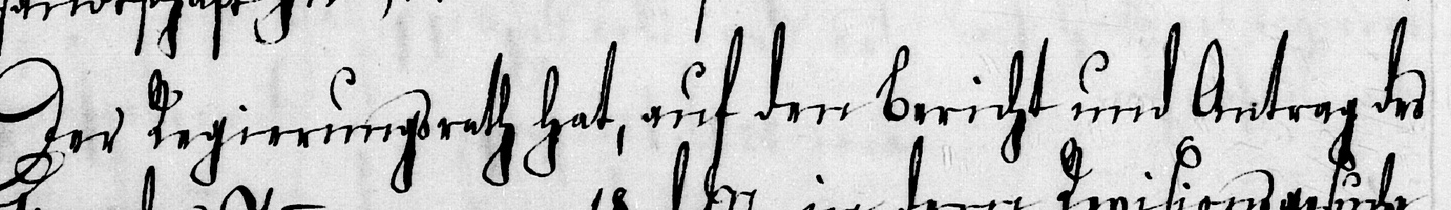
Der Regierungsrath hat, auf den Bericht und Antrag des
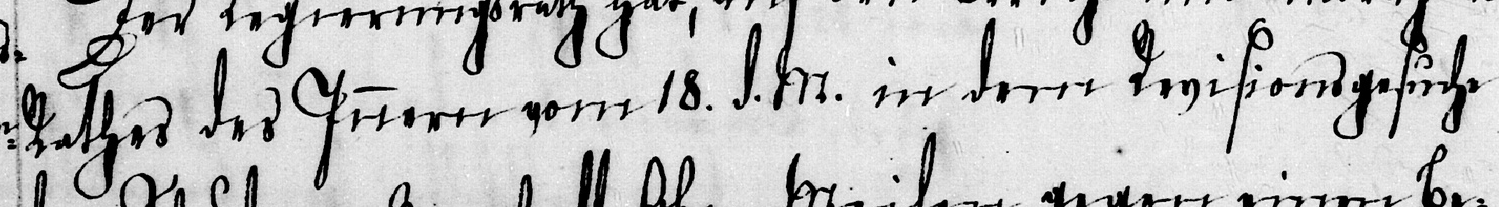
Rathes des Innern vom 18. d. M. in dem Revisionsgesuche
